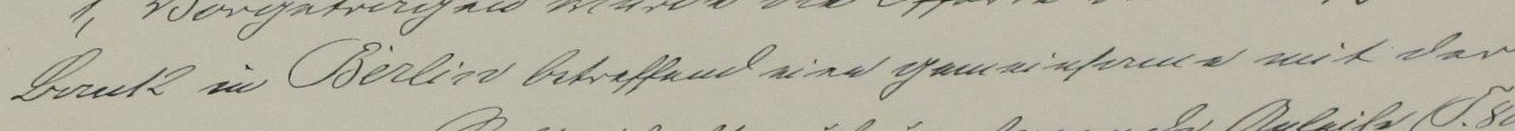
Bank in Berlin betreffend eine gemeinsame mit der
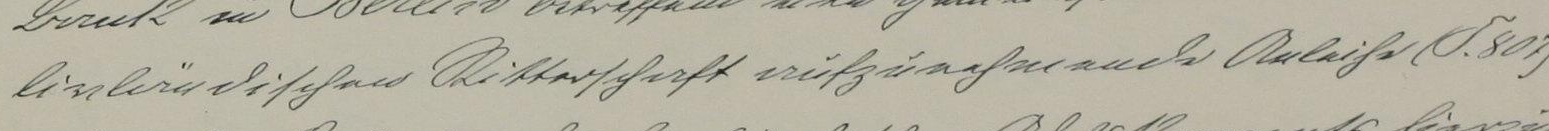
livländischen Ritterschaft aufzunehmende Anleihe (T.807)
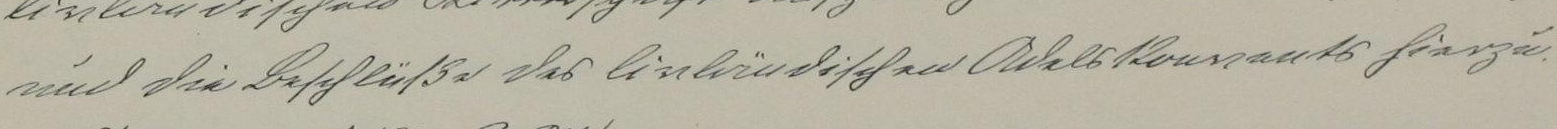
und die Beschlüße des livländischen Adelskonvents hierzu.
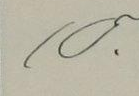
(T.
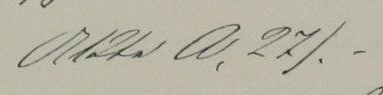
Akte A.27).
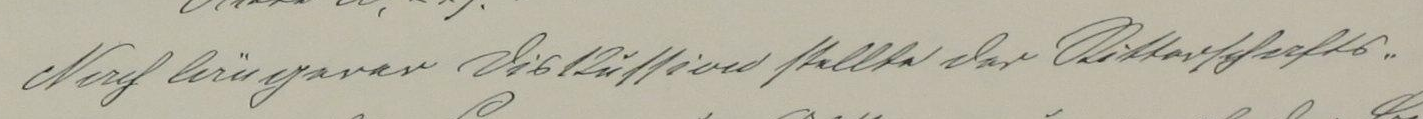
Nach längerer Diskussion stellte der Ritterschafts-
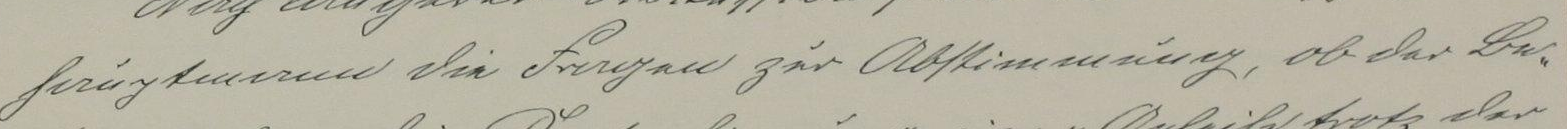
hauptmann die Fragen zur Abstimmung, ob der Be-
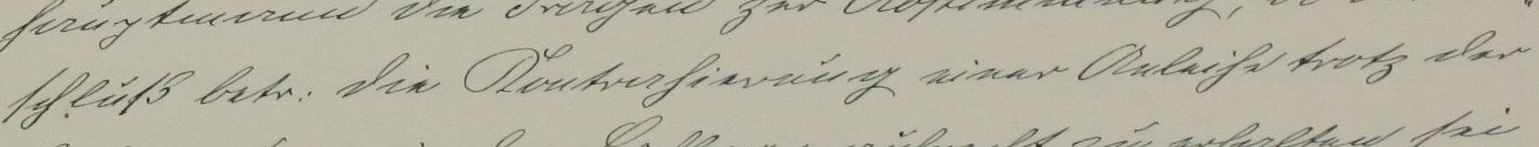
schluß betr. die Kontrahierung einer Anleihe trotz der
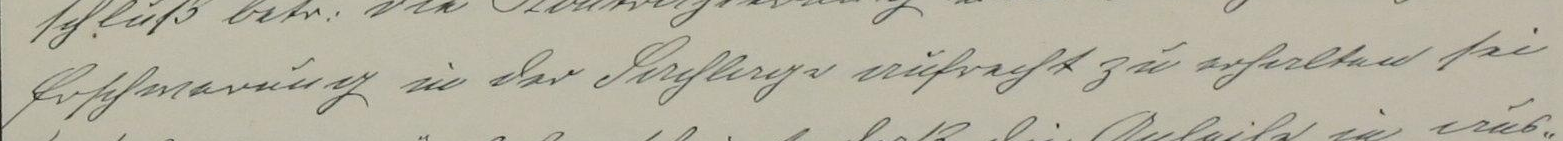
Erschwerung in der Sachlage aufrecht zu erhalten sei
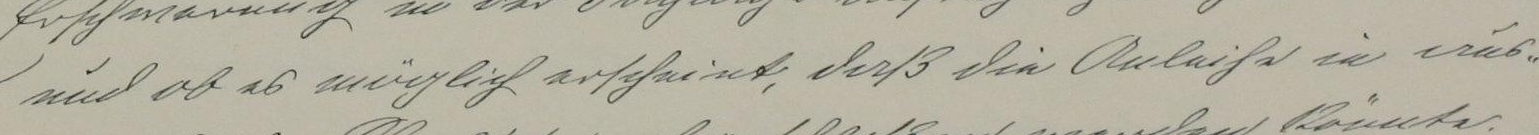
und ob es möglich erscheint, daß die Anleihe in aus-
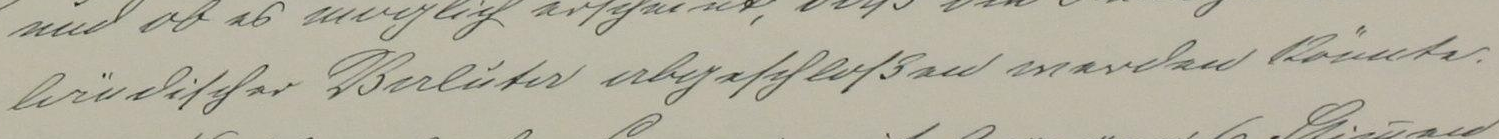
ländischer Valuta abgeschlossen werden könnte.
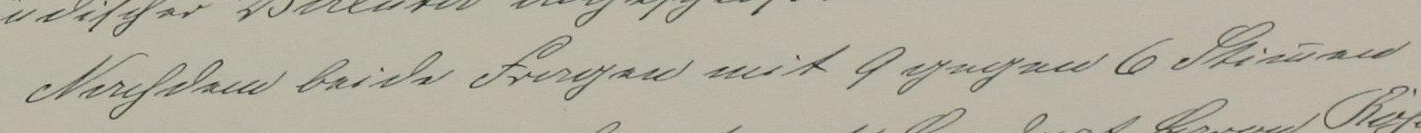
Nachdem beide Fragen mit 9 gegen 6 Stimmen
